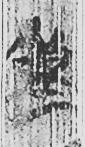陳
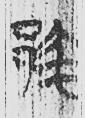○（蔡）
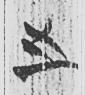之
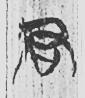君
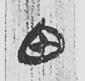囟
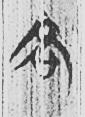各
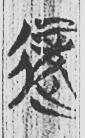復
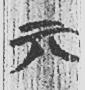亓
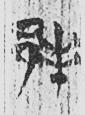邦
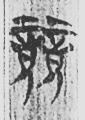競
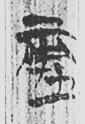坪
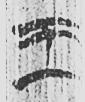王
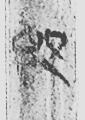即
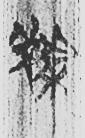殜
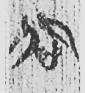卲
